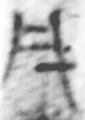凡
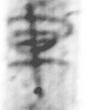車
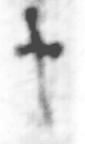十
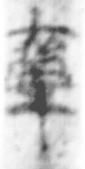𨍱（乘）
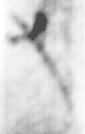又
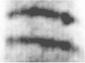二
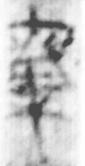𨍱（乘）
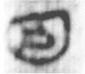四
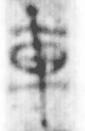車
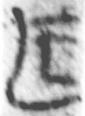○（圓）
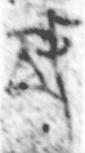攻（工）
